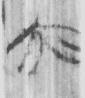亦
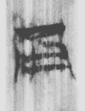甬
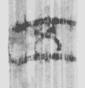矼
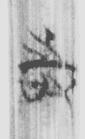𠱾
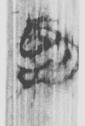解
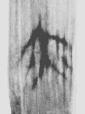亦
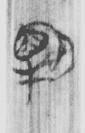解
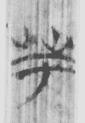芋
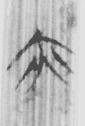亦
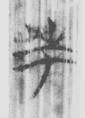芋
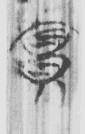實
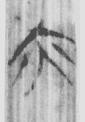亦
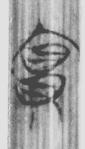實
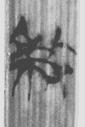殺
